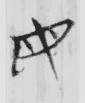母
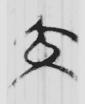交
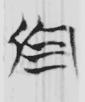於
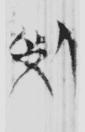死
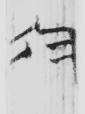今
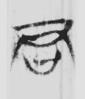君
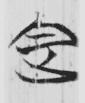定
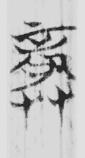龏
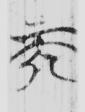而
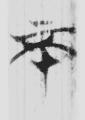不
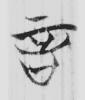言
